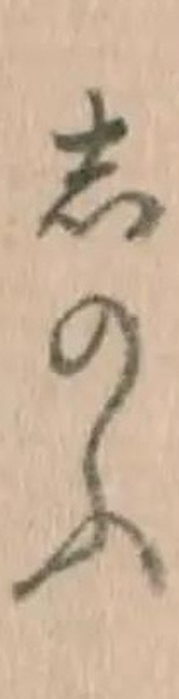しのふ
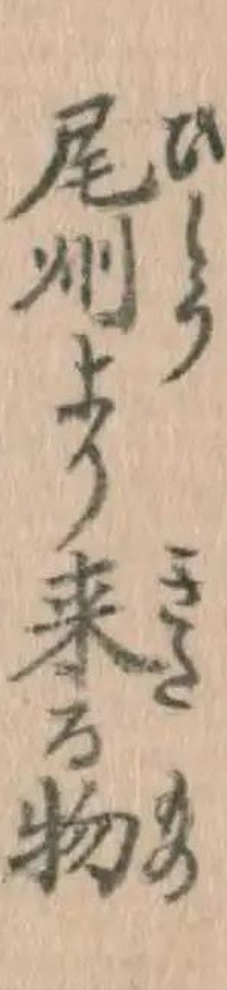尾州より来る物
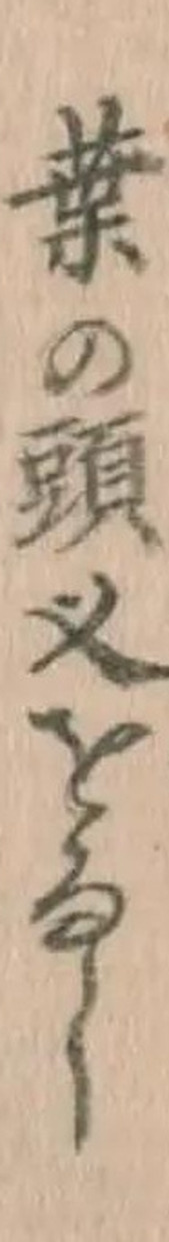葉の頭叉をなし
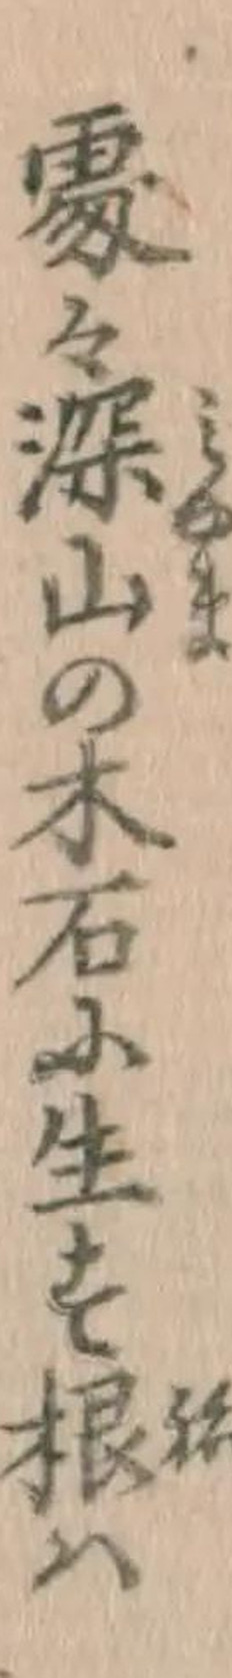処々深山の木石に生す根は
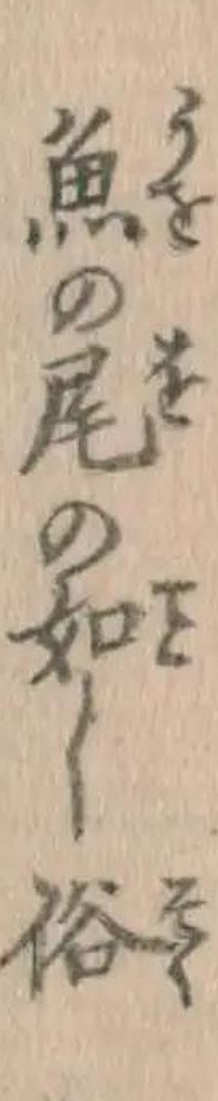魚の尾の如し俗
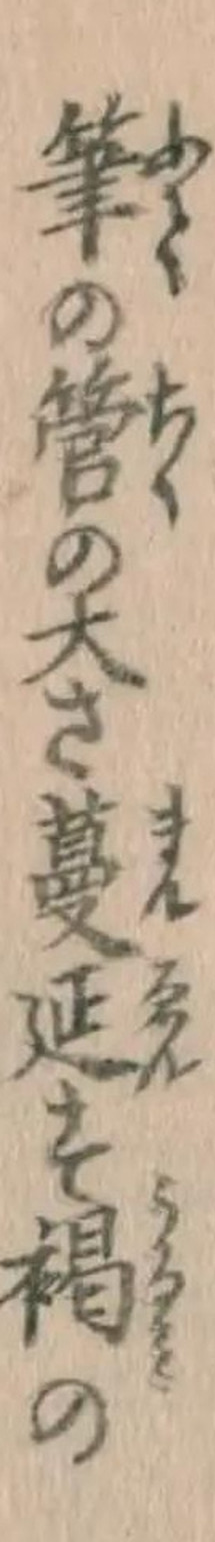筆の管の大さ蔓延す褐の
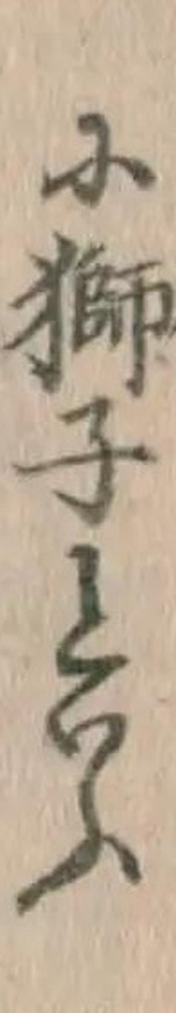に獅子といふ
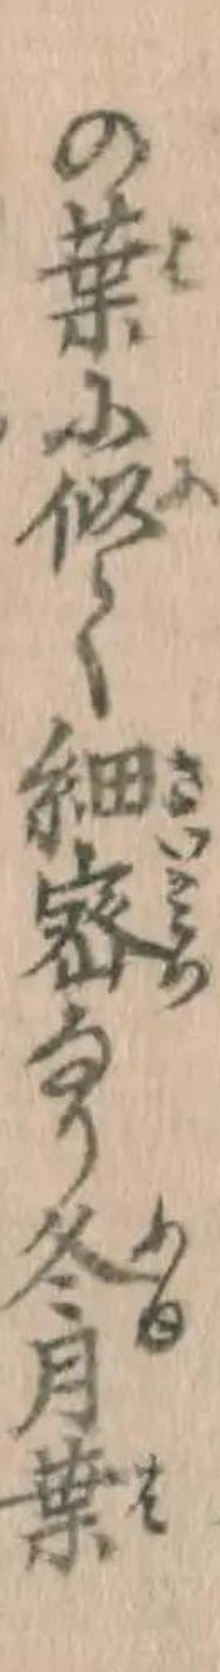の葉に似て細密なり冬月葉
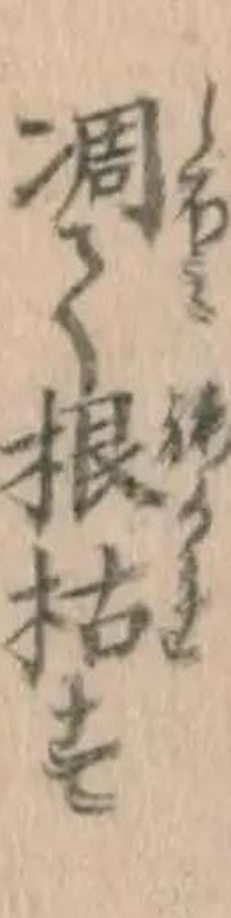凋て根枯す

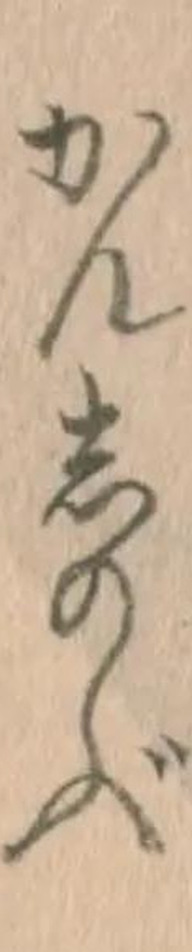かんしのぶ
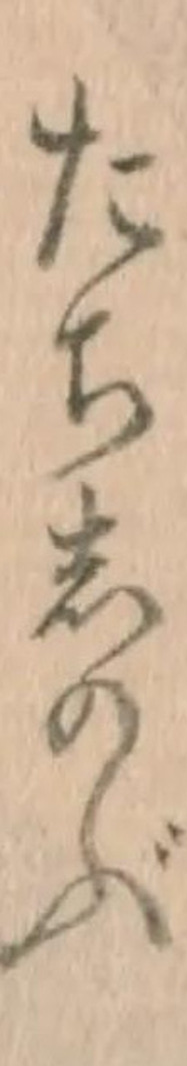たちしのぶ
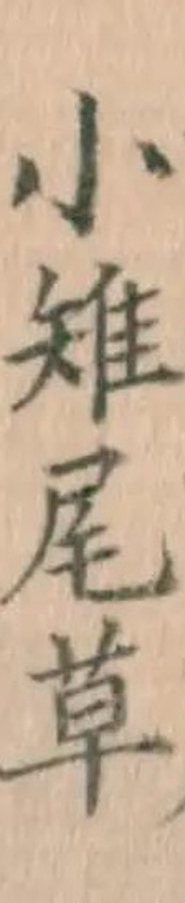小雉尾草
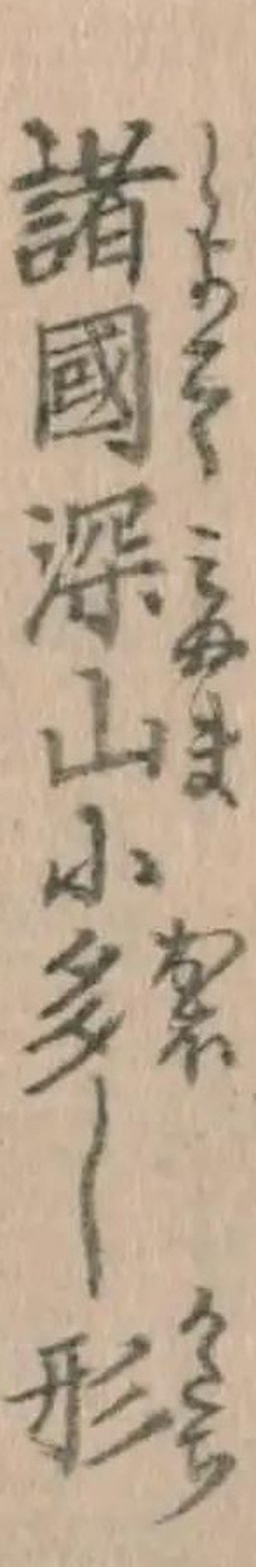諸国深山に多し形
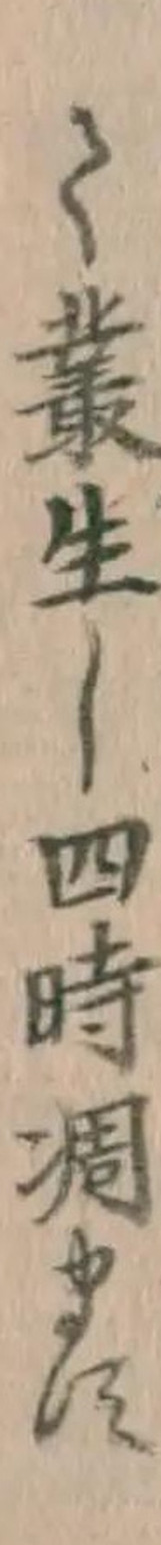て叢生し四時凋ます
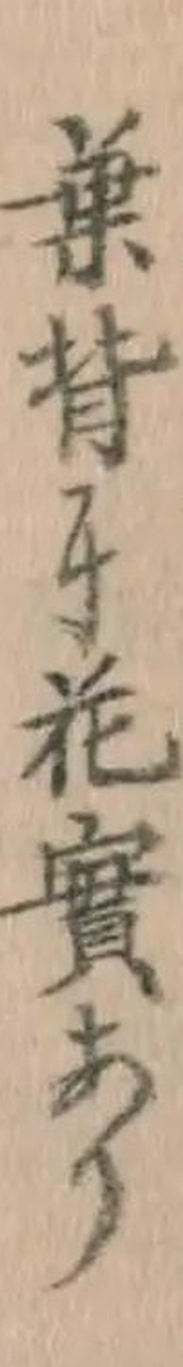葉背に花実あり
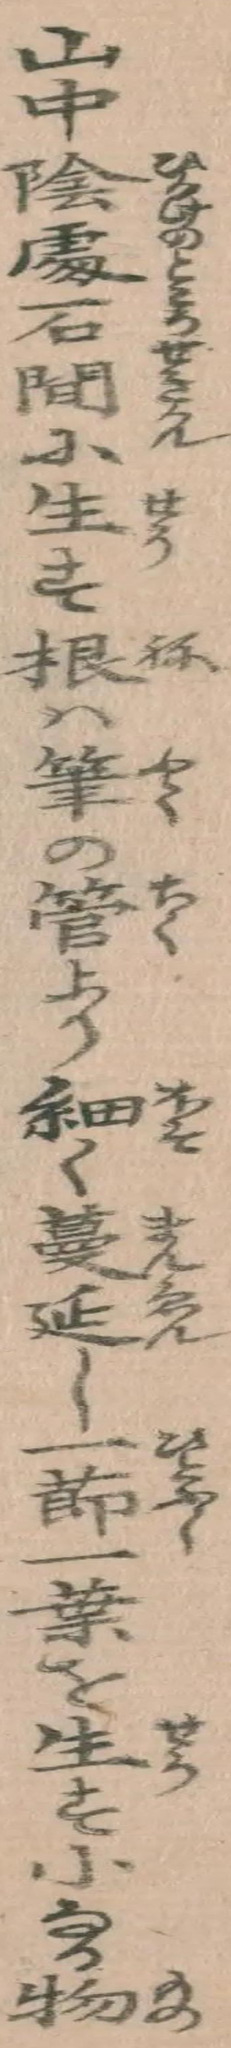山中陰処石間に生す根は筆の管より細く蔓延し一節一葉を生す小なる物
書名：本草図譜. 巻34-36
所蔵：国立国会図書館 National Diet Library, JAPAN
